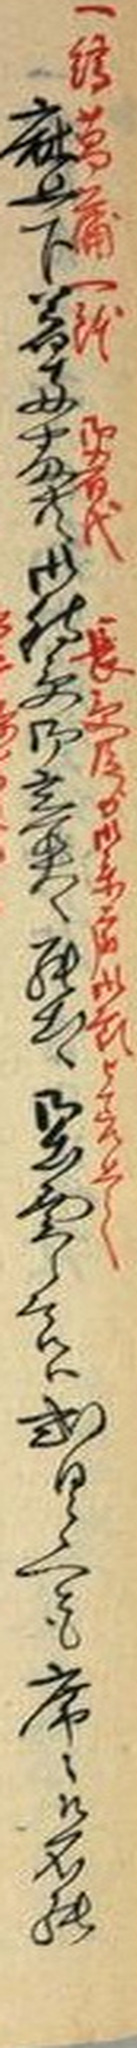麻上下着当番共御待受御玄関へ罷出候御出殿之節ハ式日ニ候へとも席々江不罷
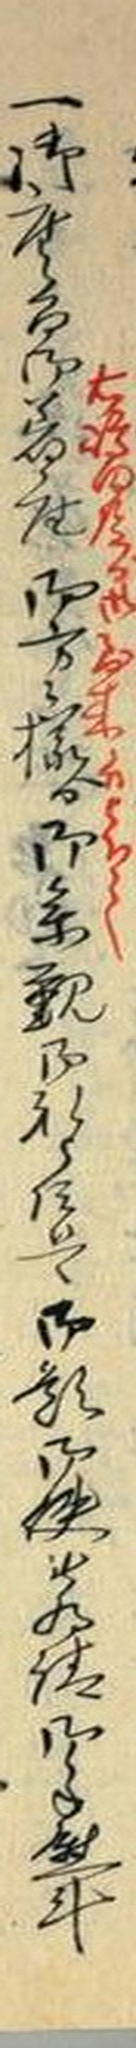一御座之間御着座御方々様ゟ御参観御礼被仰上候御歓御使被請御手熨斗
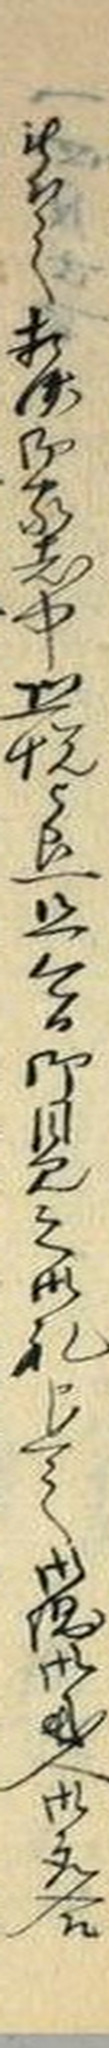被下之相済御家老中恐悦被申上且今日御目見之御礼申上之御側御用人御取合
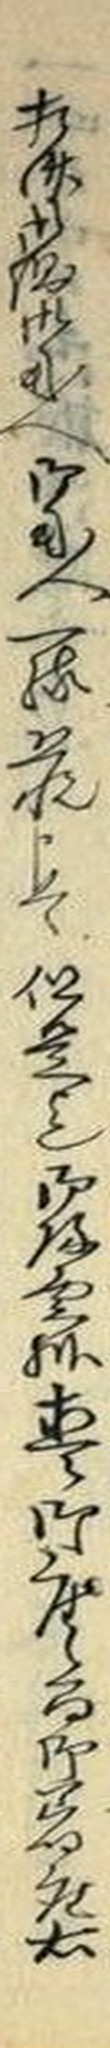相済御側御用人御用人一統恐悦申上候但是迄御帰殿掛直々御座之間御着座右
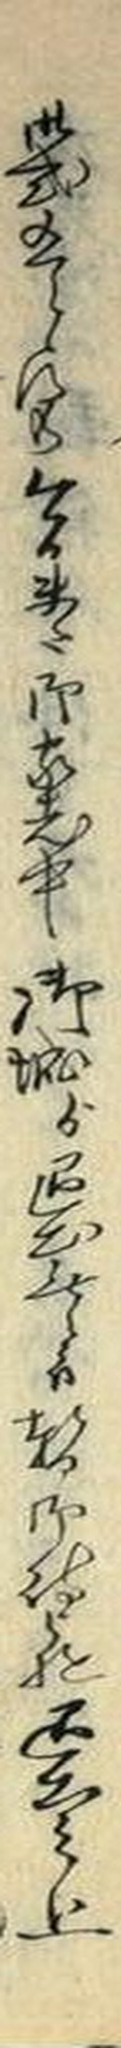御式有之候得共今日夫々御家老中御城ゟ退出無之候ニ付暫御待被遊退出之上
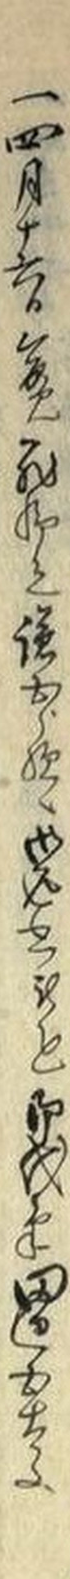一四月十六日今晩飛脚立謙五郎様へ御返書被進御代筆田辺五太夫
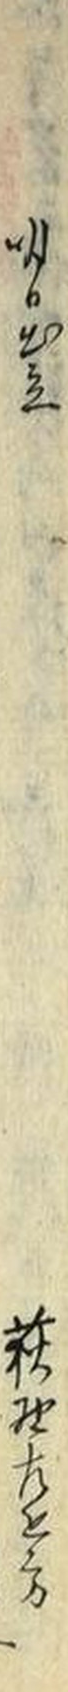明日出立荻野左近方
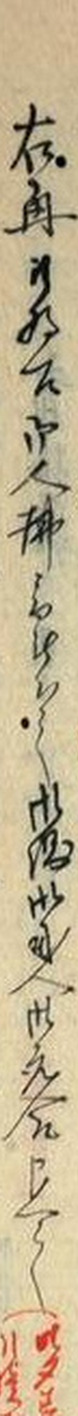右再被為召御人払ニ而被下之御側御用人御取合申上之
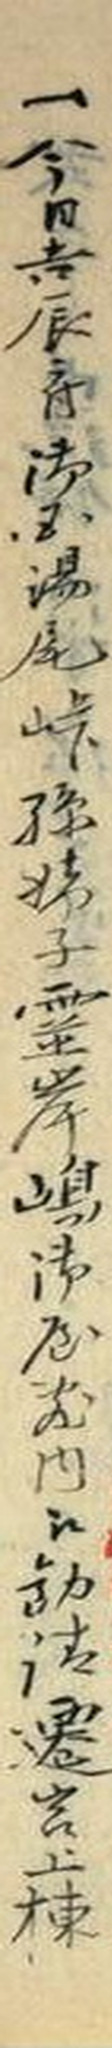一今日吉辰ニ付御国湯尾峠孫嫡子霊岸嶋御屋敷内江勧請遷宮上棟

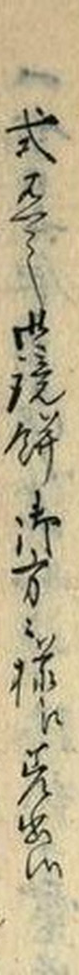式有之御鏡餅御方々様江差出候
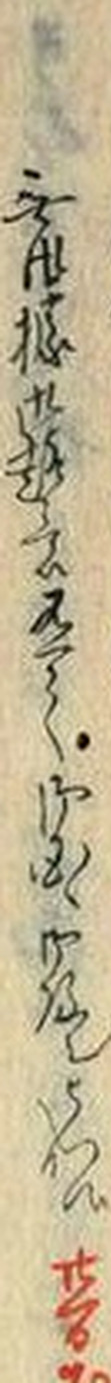無御拠御趣意有之御国へ御帰シ被成候
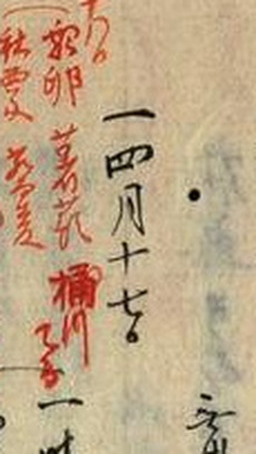一四月十七日
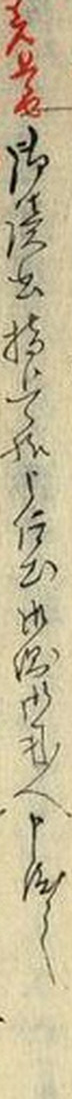御読書差上候様被仰出御側御用人申渡之
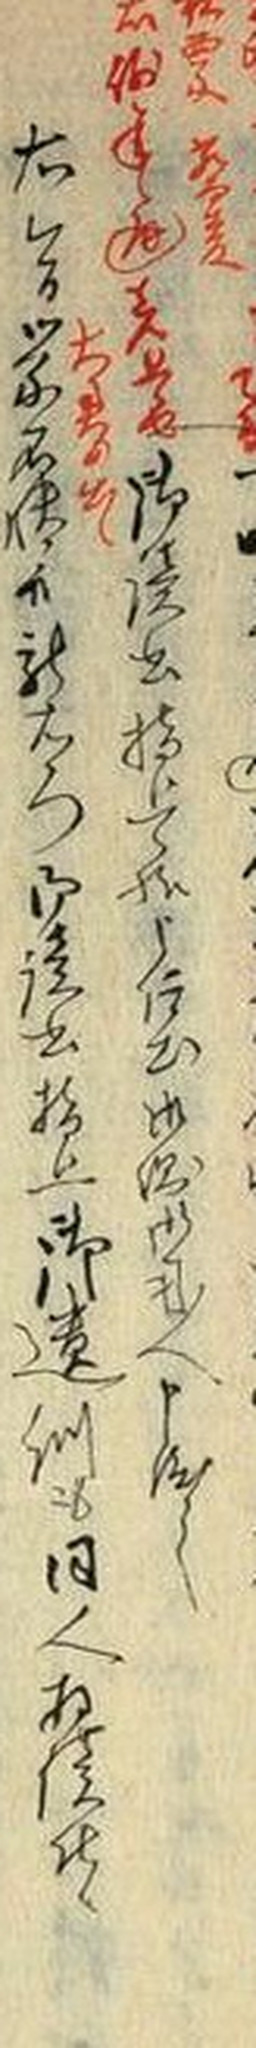右今日栄不快ニ付新右衛門御読書指上御遺訓も同人拝読仕候
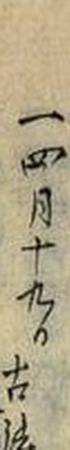一四月十九日
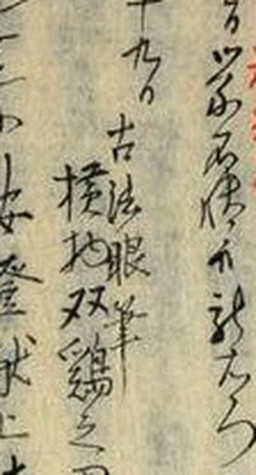古法眼筆
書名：少傅日録抄（斉承付側向頭取日記、在府）
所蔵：福井県文書館 Fukui Prefectural Archives
